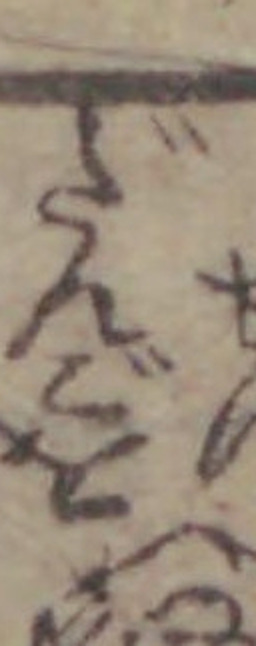だんごを
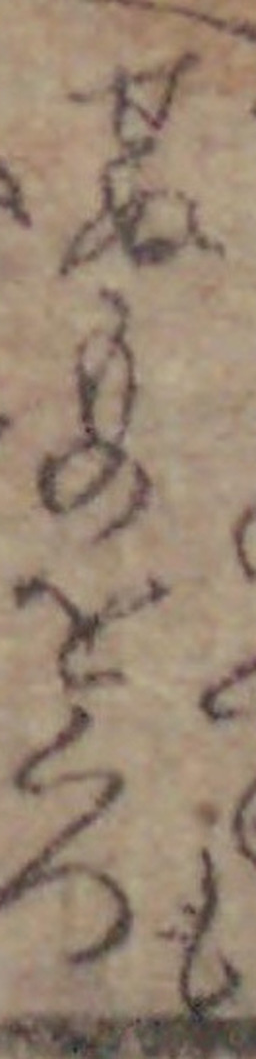せぬものをくつ
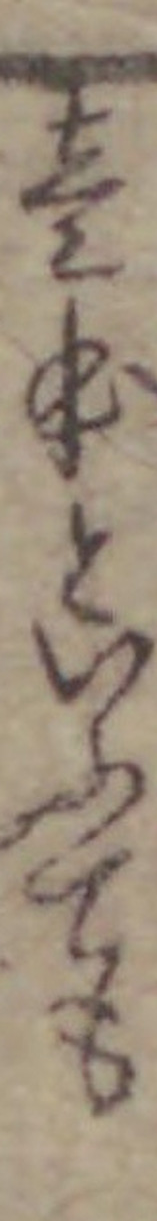壱本といふても
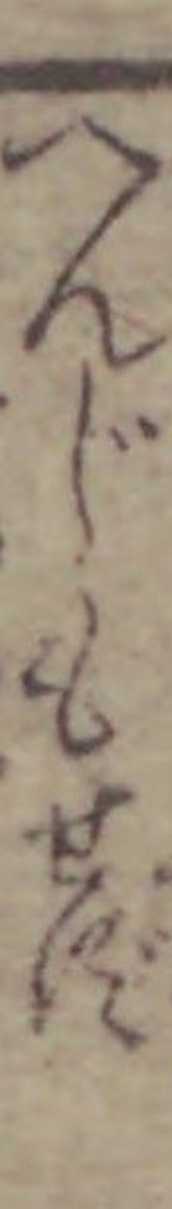へんじもせず
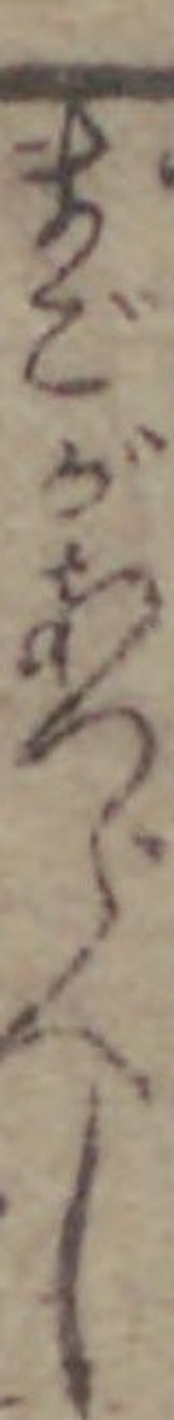まごがあつらへし
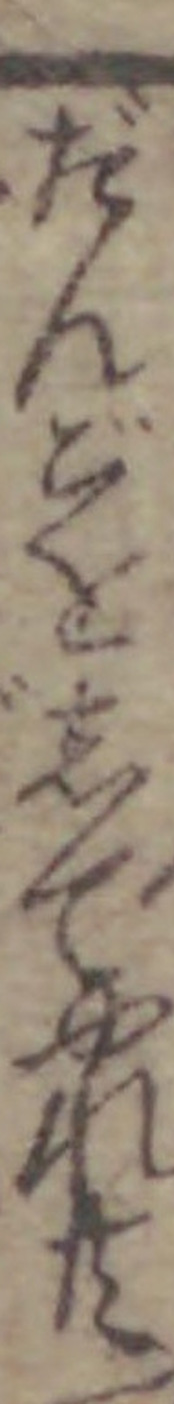だんごをしてやれ共
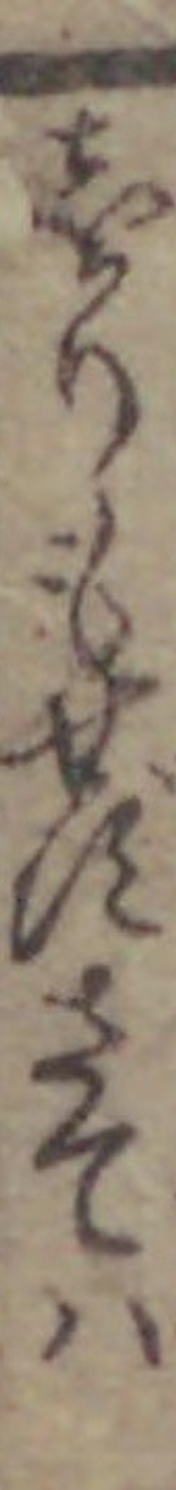しかりもせずさては
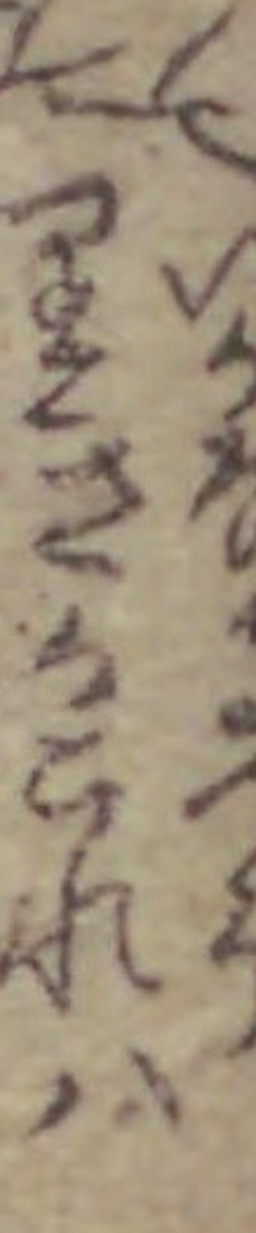りきかこれは
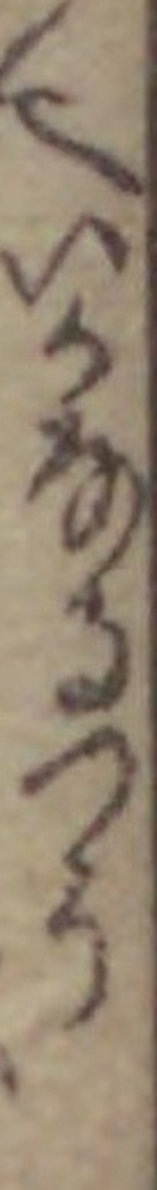いかなるつう
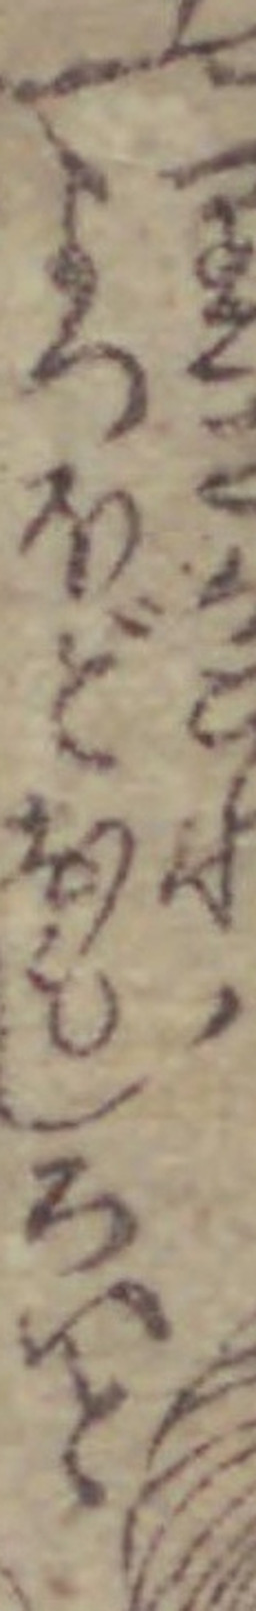よつほどおもしろいと
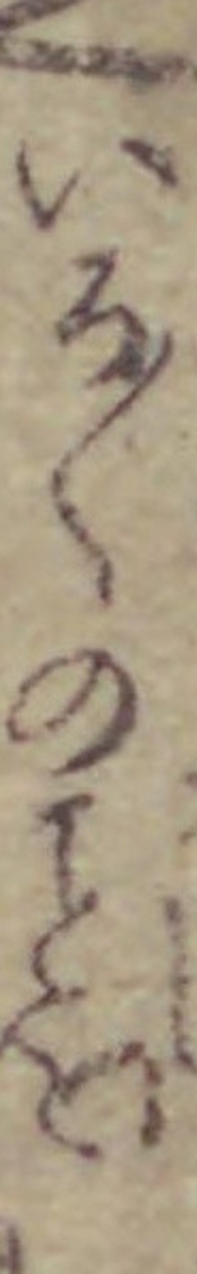いろ〳〵のことを
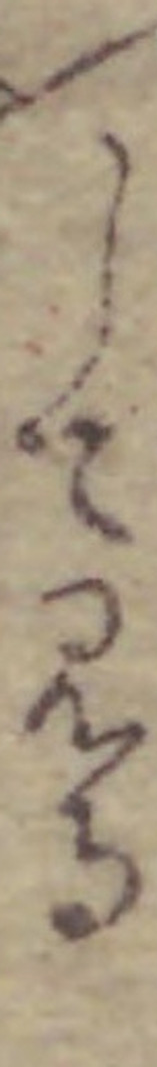してみる
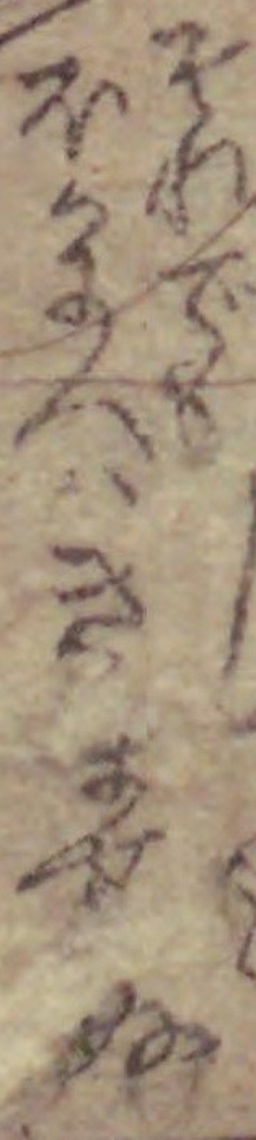ほかに人はきませぬ

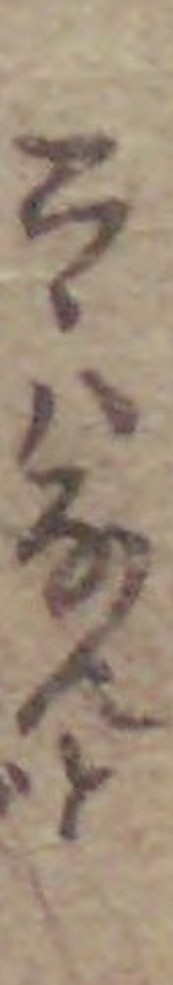こゝはなんと
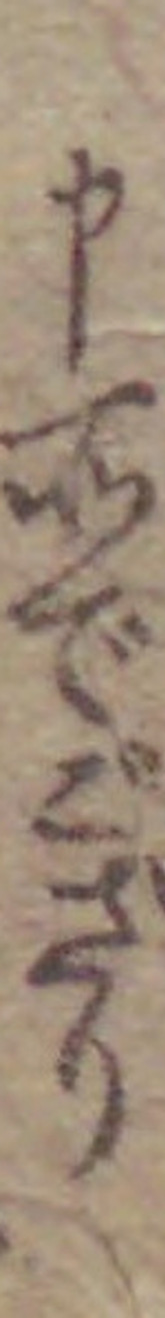申所でござり
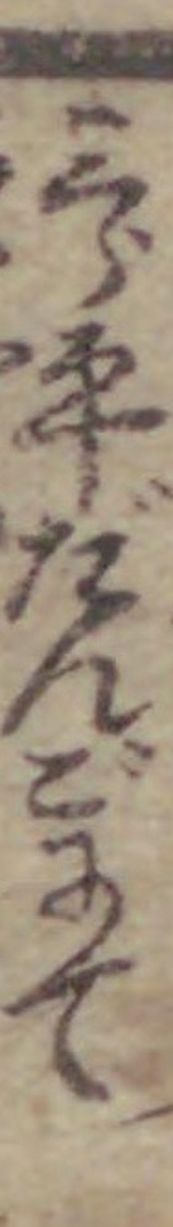三郎平だんごにて
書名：近頃嶋めぐり 3巻
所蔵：国立国会図書館 National Diet Library, JAPAN
